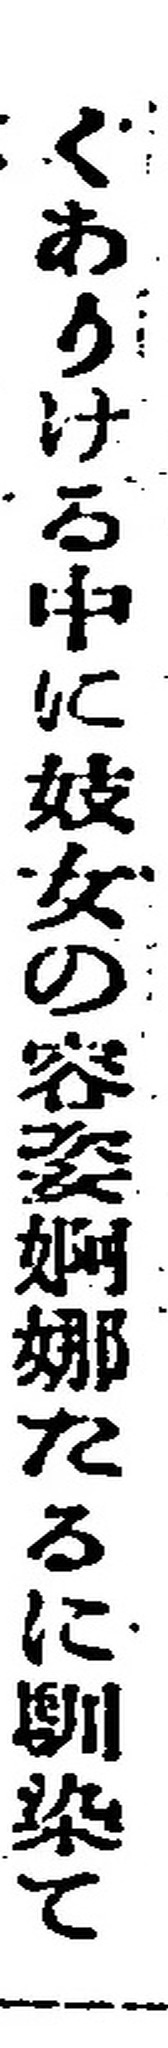くありける中に妓女の容姿婀娜たるに馴染て
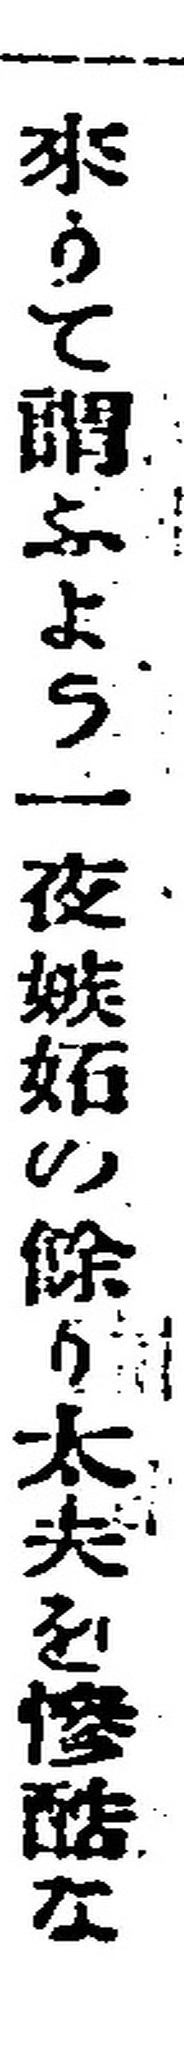来りて謂ふよう一夜嫉妬の余り太夫を惨酷な
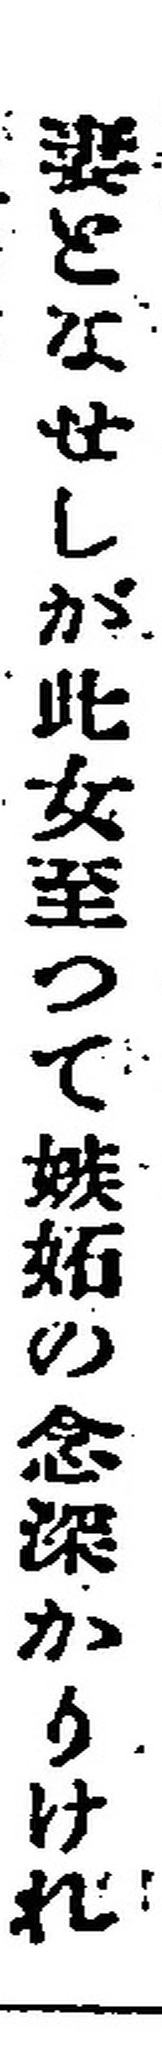妻となせしが此女至つて嫉妬の念深かりけれ
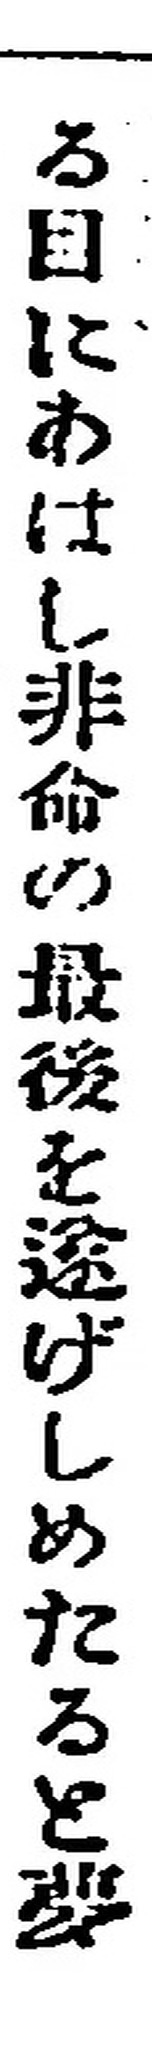る目にあはし非命の最後を遂げしめたると夢
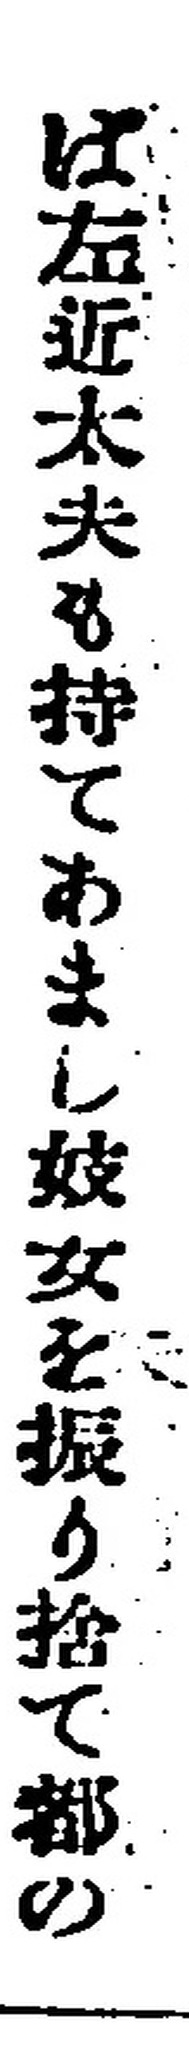ば左近太夫も持てあまし妓女を振り捨て都の
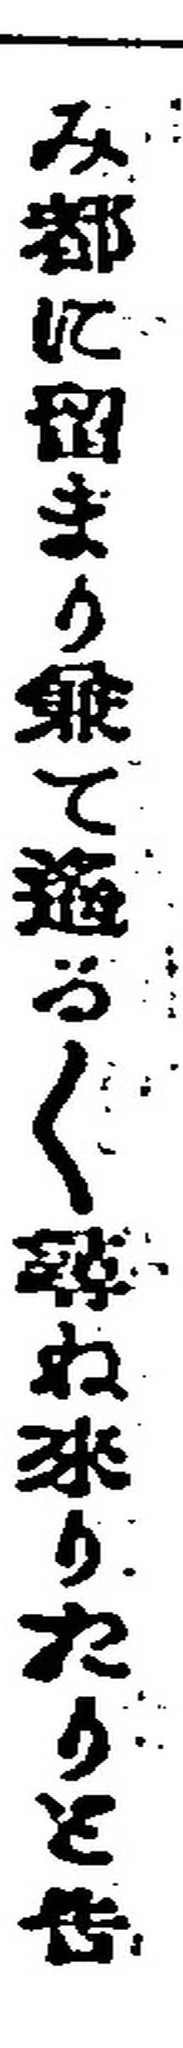み都に留まり兼て遥る〳〵尋ね来りたりと告

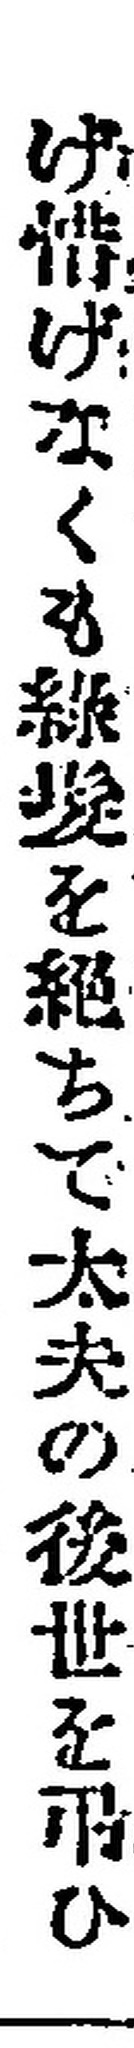げ惜げなくも緑髪を絶ちて太夫の後世を弔ひ
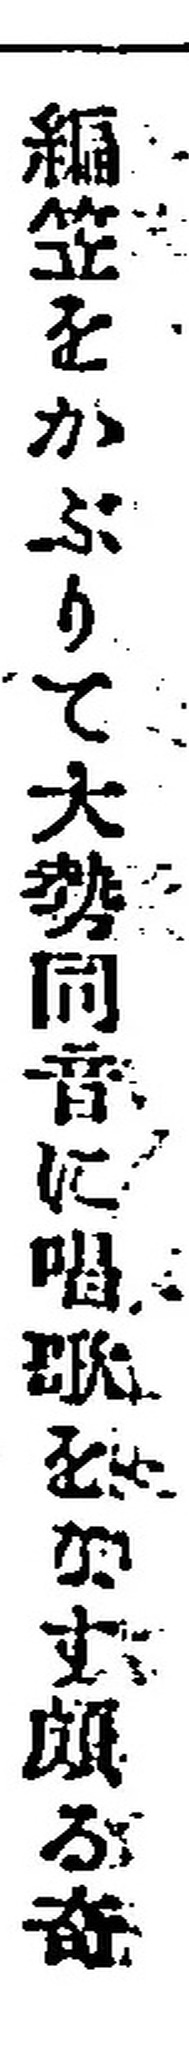編笠をかぶりて大勢同音に唱歌をなす頗る奇
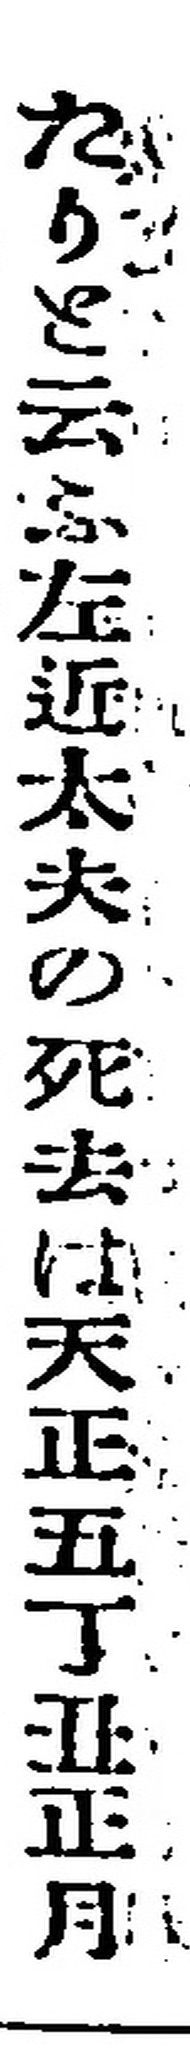たりと云ふ左近太夫の死去は天正五丁丑正月
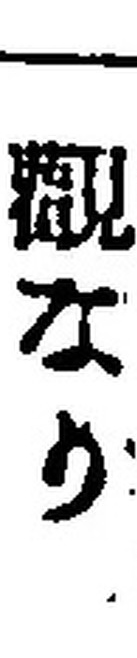観なり
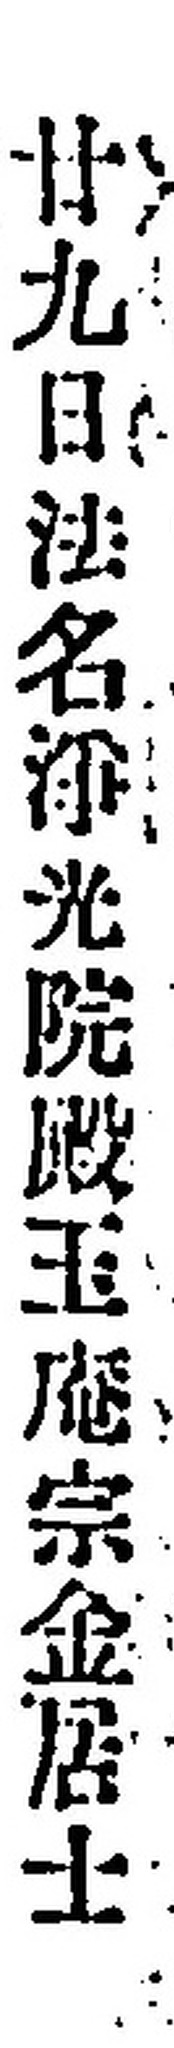廿九日法名浄光院殿玉庵宗金居士
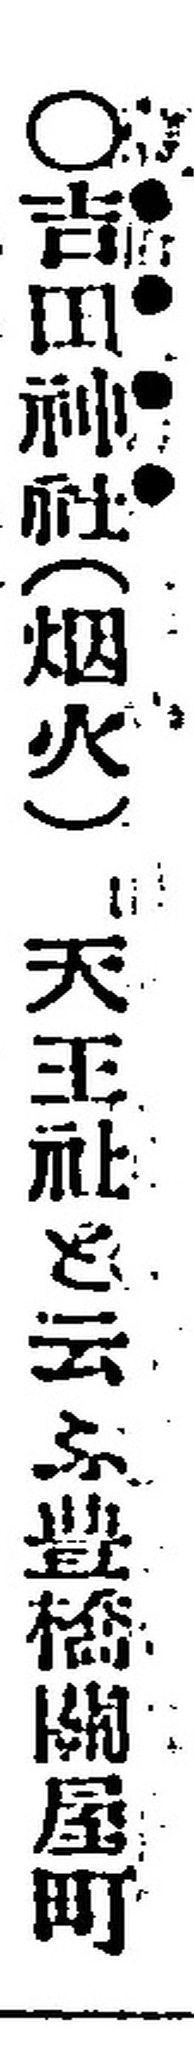○吉田神社(烟火)天王社と云ふ豊橋関屋町
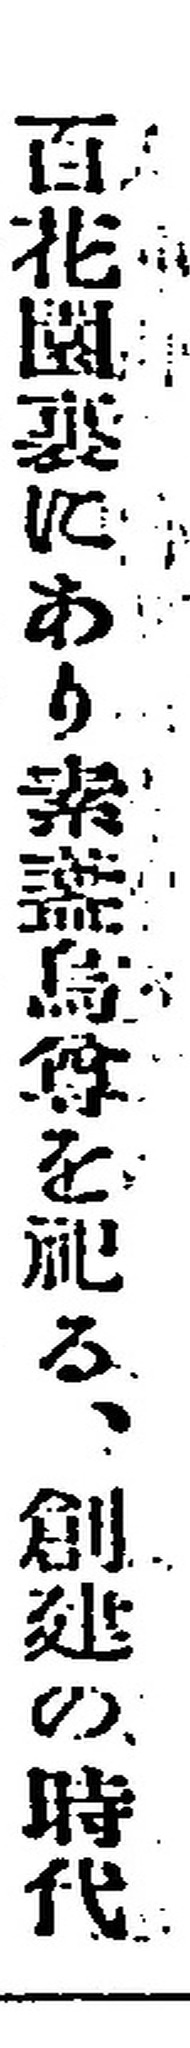百花園裏にあり素盞烏尊を祀る、創建の時代
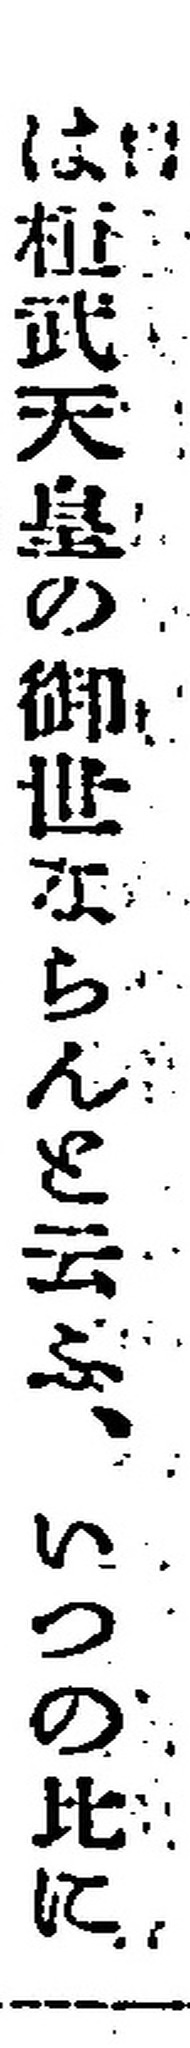は桓武天皇の御世ならんと云ふ、いつの比に
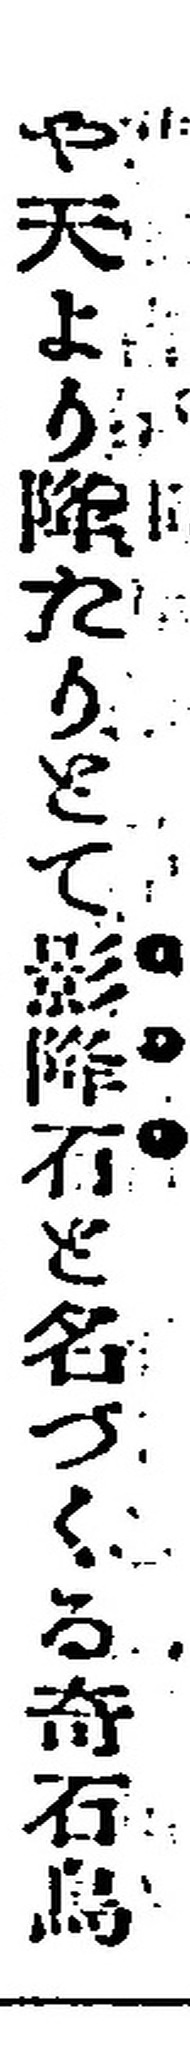や天より降たりとて影降石と名づくる奇石鳥
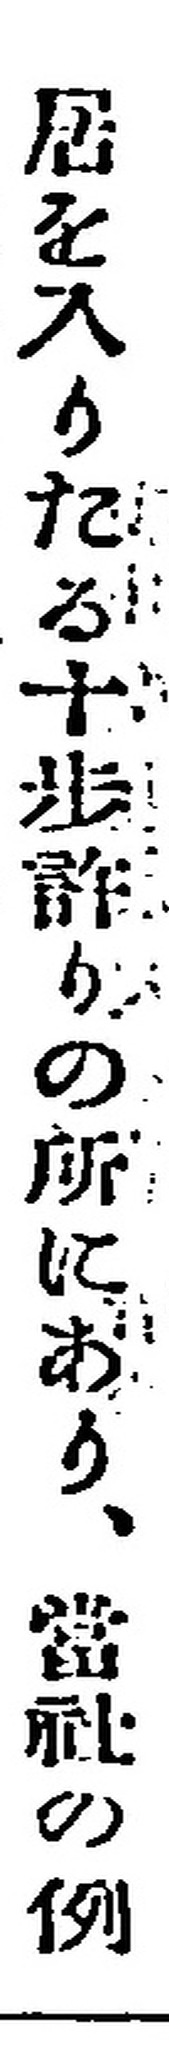居を入りたる十歩許りの所にあり、当社の例
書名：東参名勝案内
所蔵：国立国会図書館 National Diet Library, JAPAN
